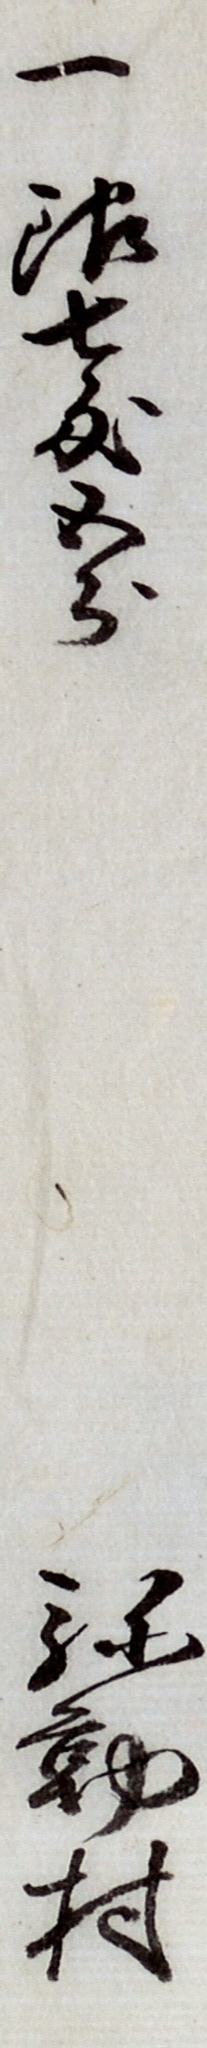一銀七匁五分弥勒村
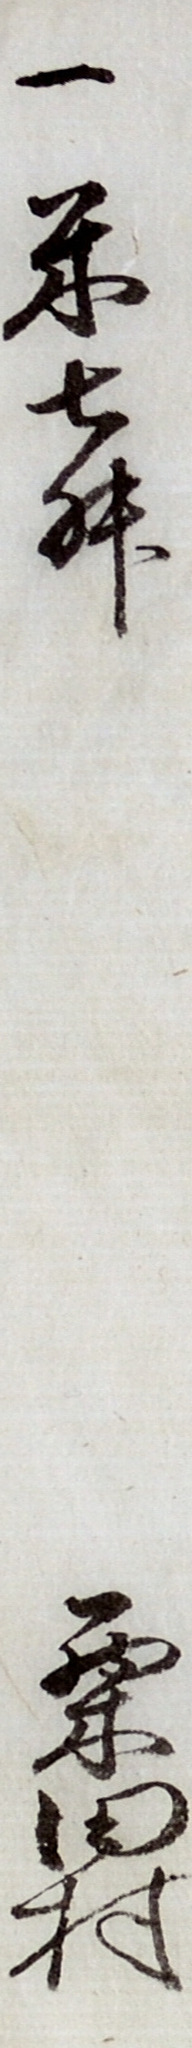一米七升栗田村

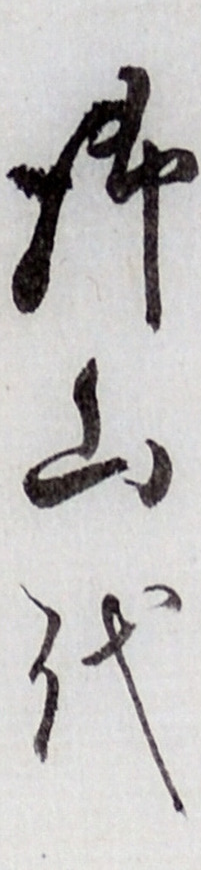御山代
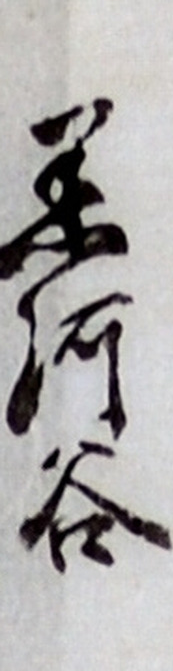黒河谷
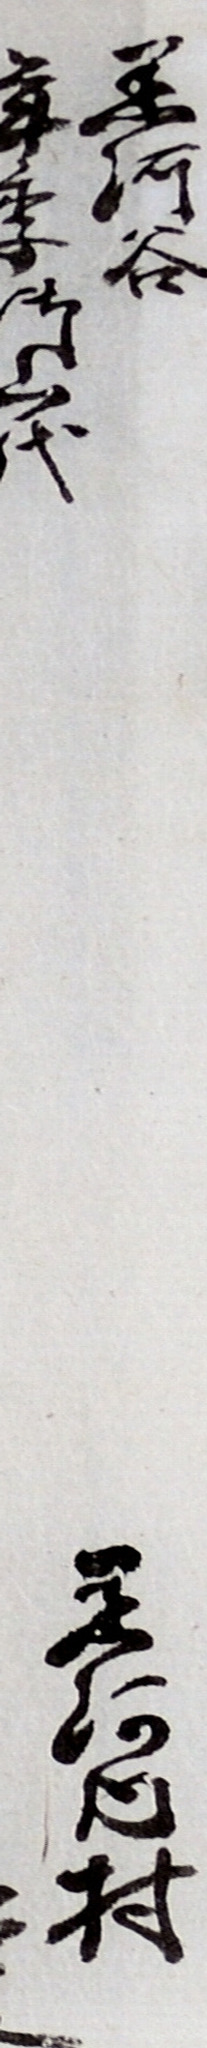年季御山代黒河内村
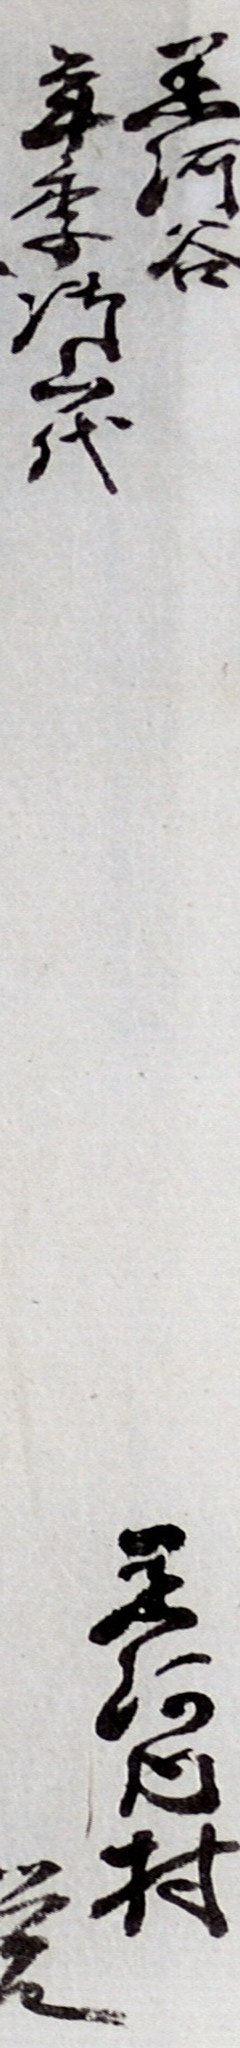年季御山代黒河内村
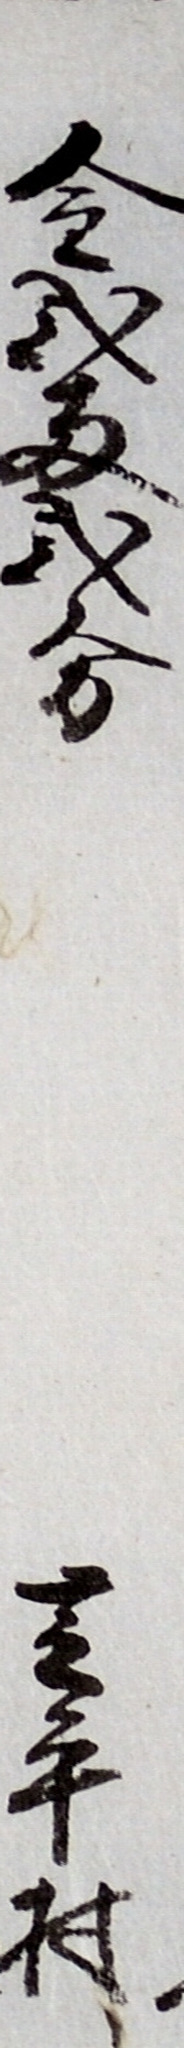一金弐両弐分覚八
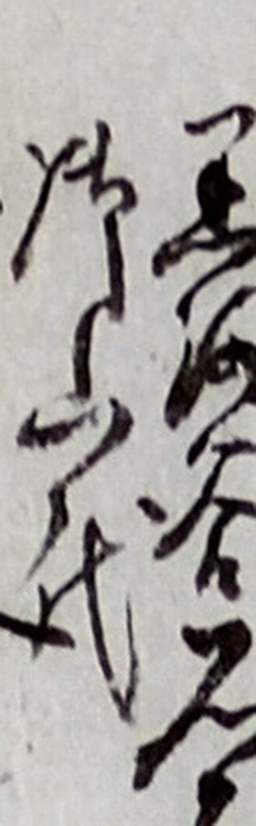御山代
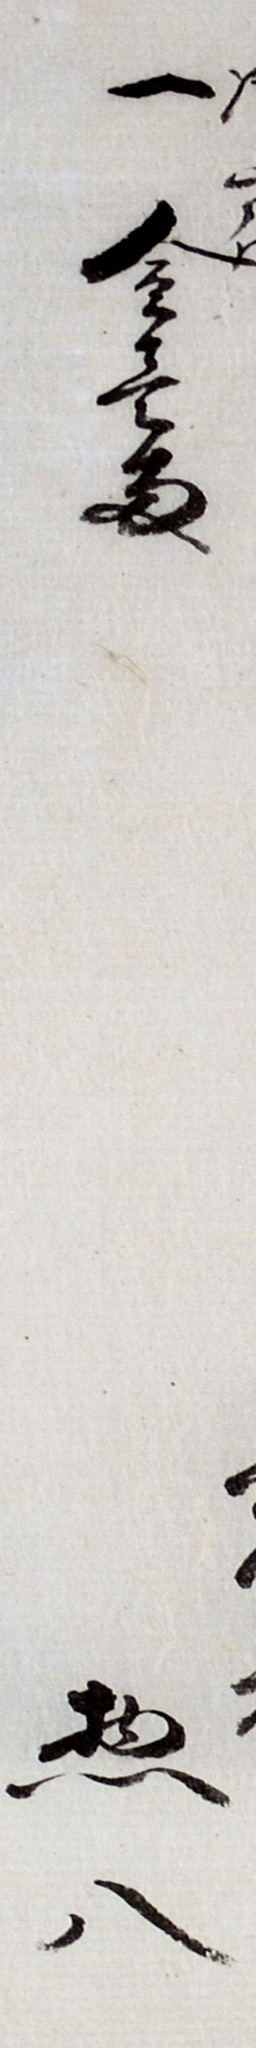一金壱両惣八
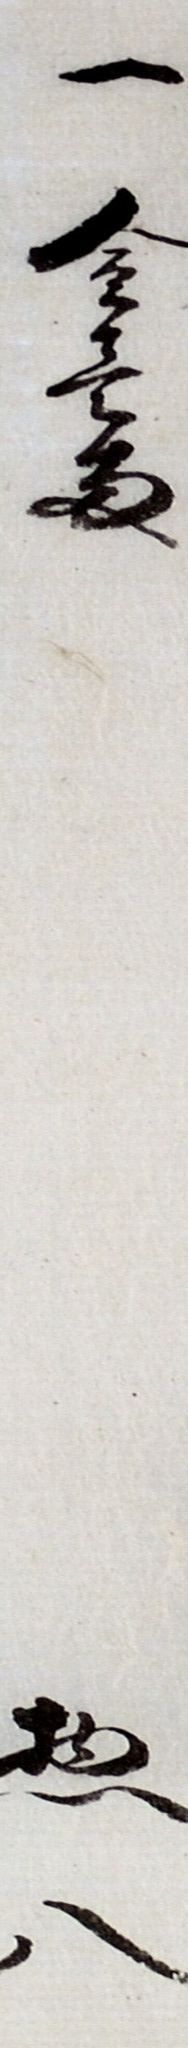一金壱両惣八
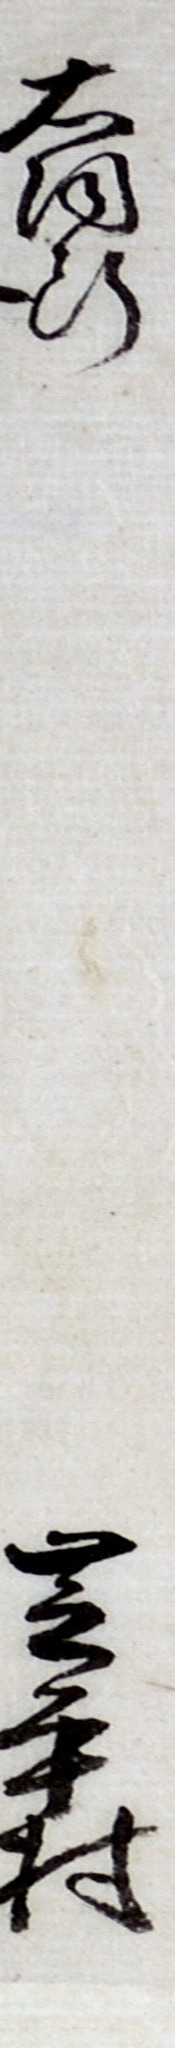右同断芝平村
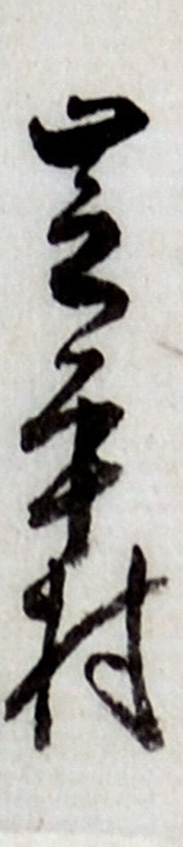芝平村
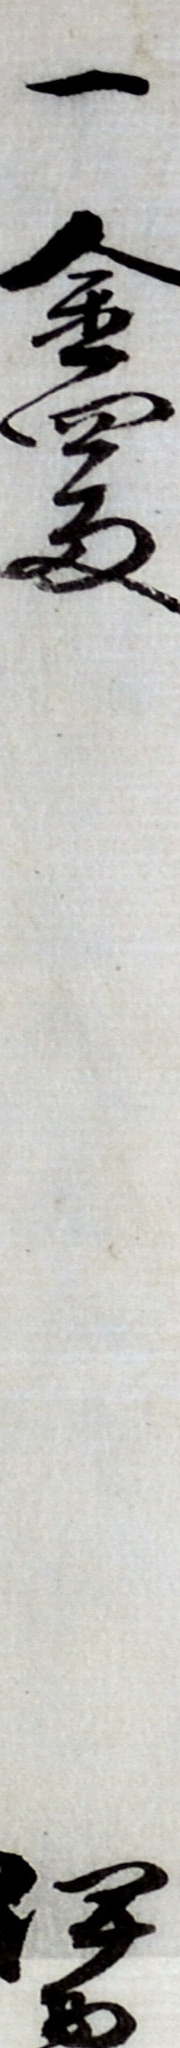一金四両伊惣左
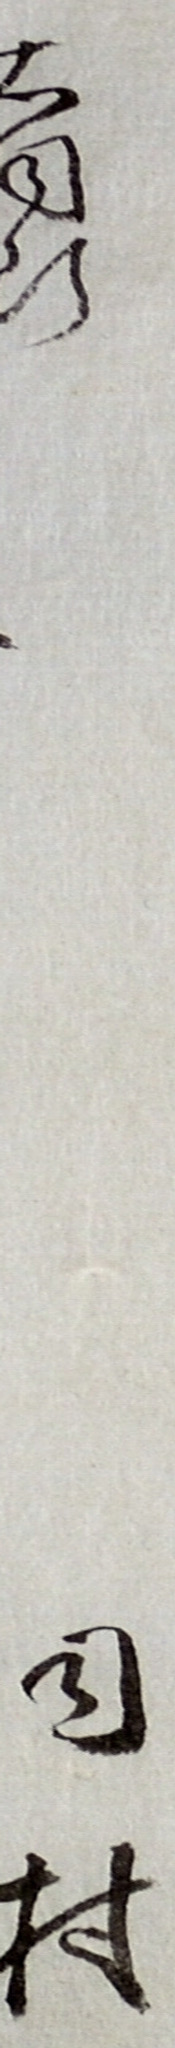右同断同村
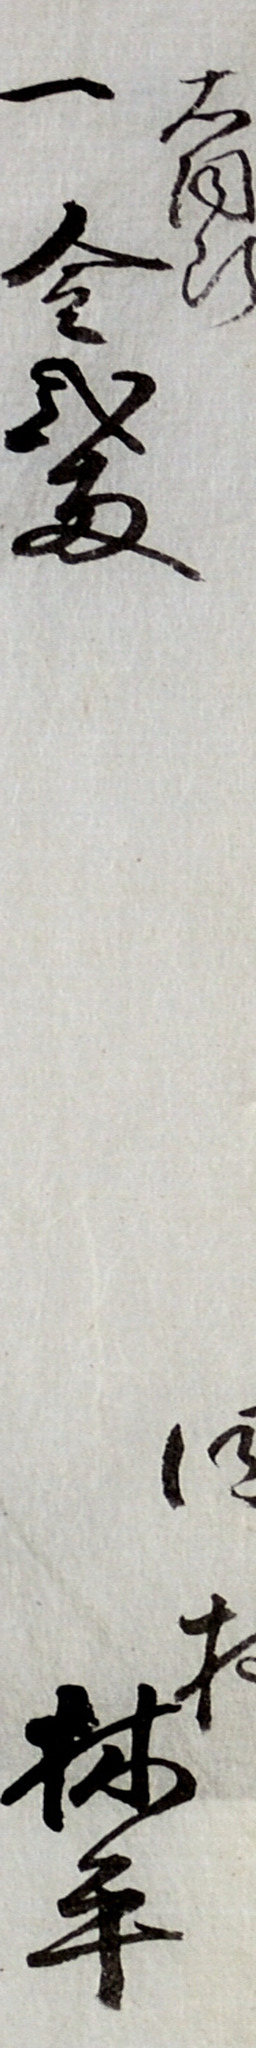一金弐両林平
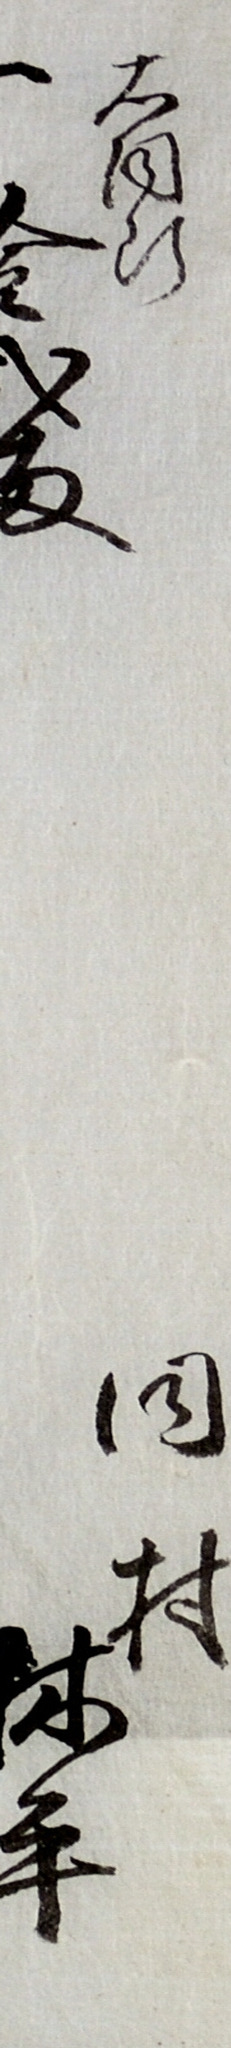一金弐両林平
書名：官林下草御山代取立帳
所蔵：伊那市立高遠町図書館・合同会社AMANE
